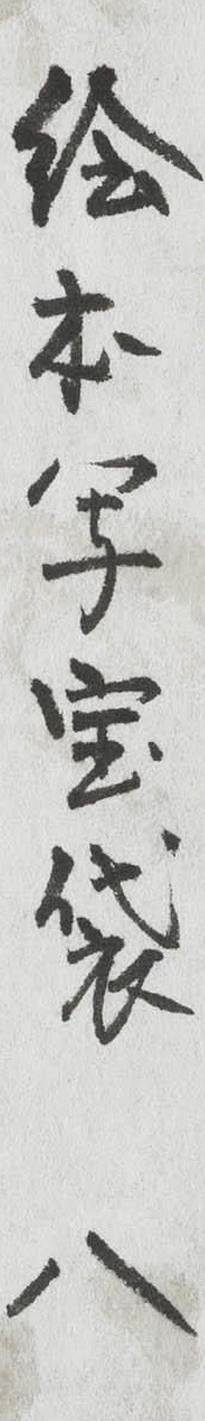絵本写宝袋八
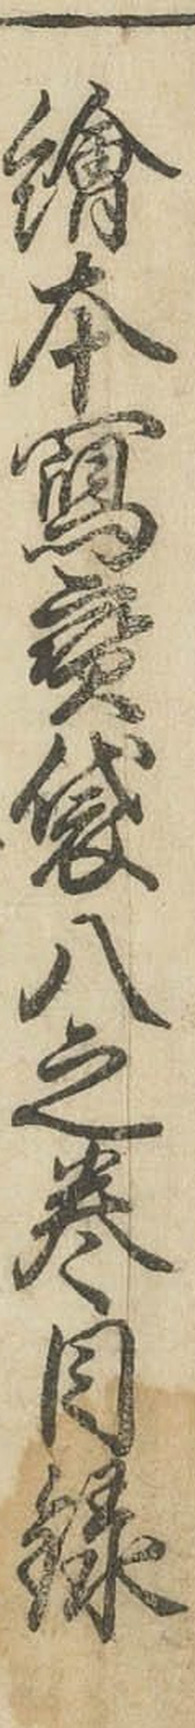絵本写宝袋八之巻目録
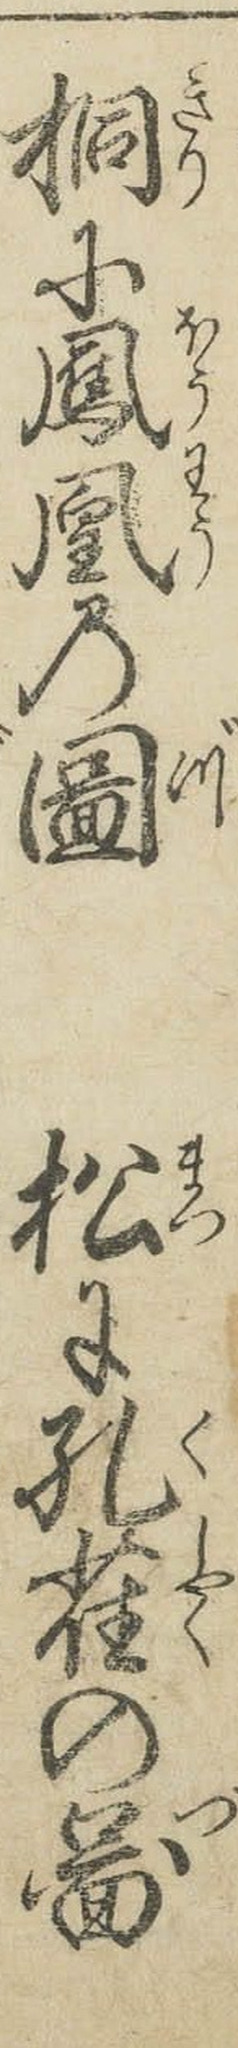桐に鳳凰の図松に孔雀の図
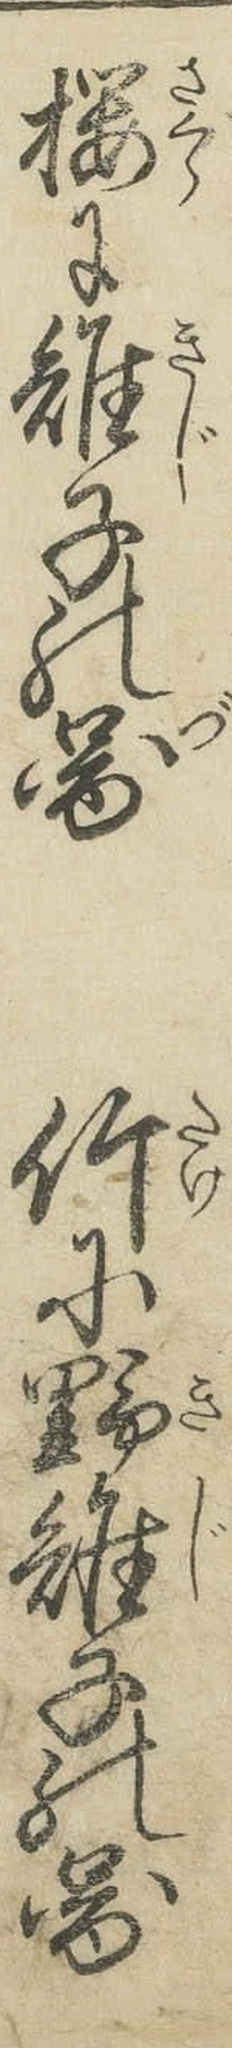桜に雉子の図竹に野雉子の図
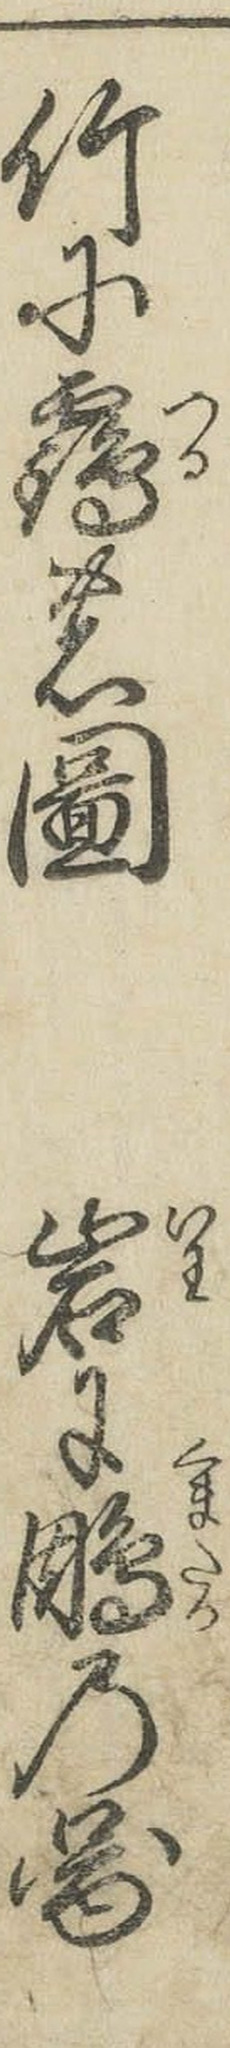竹に鶴の図岩に鵰の図
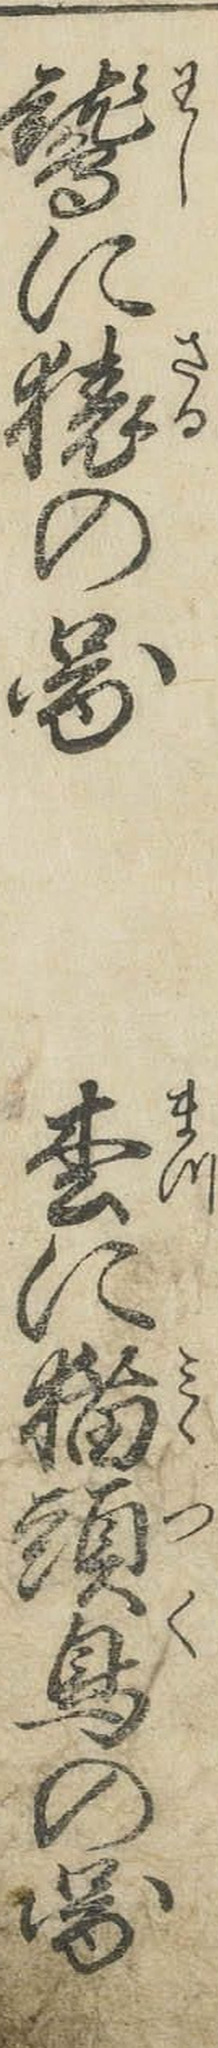鷲に猿の図松に猫頭鳥の図
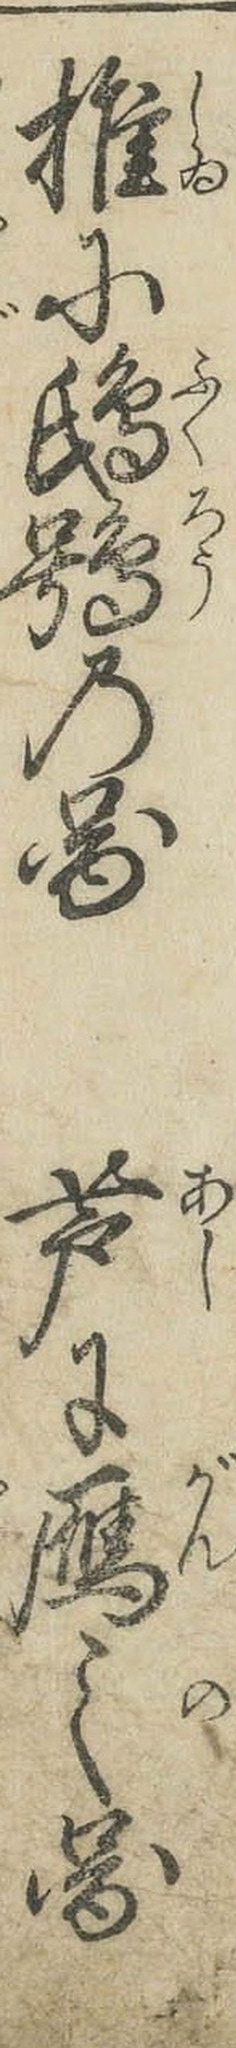椎に鴟鴞の図芦に鴈之図

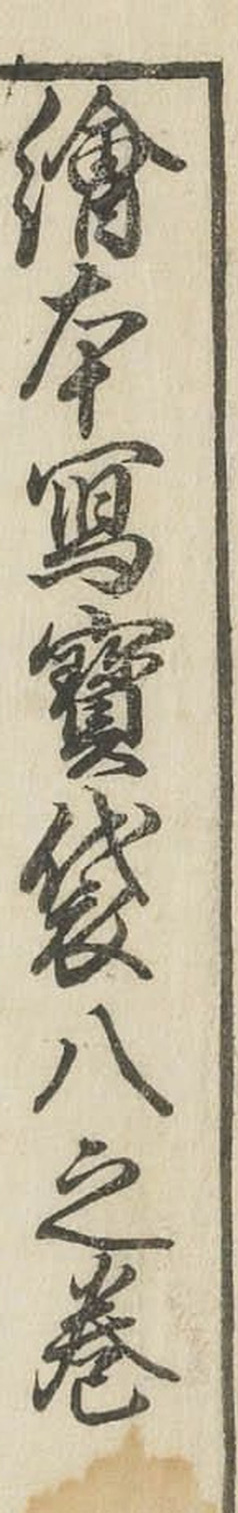絵本写宝袋八之巻
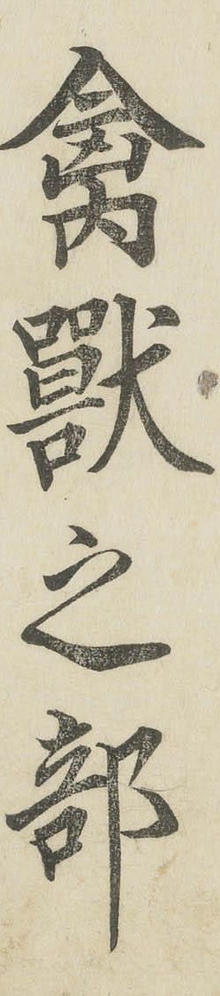禽獣之部
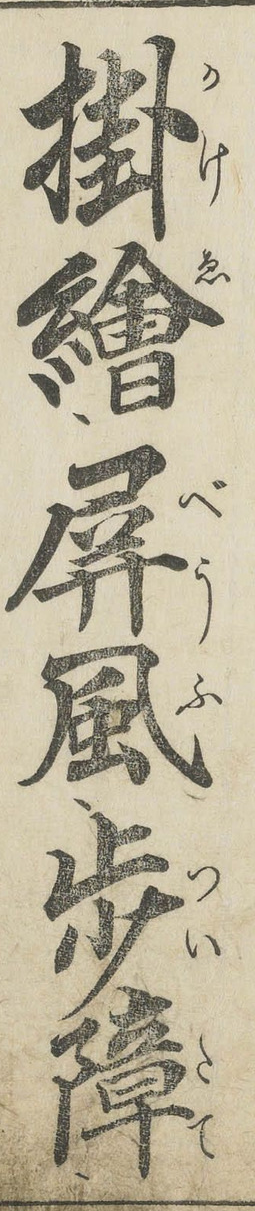掛絵屏風歩障
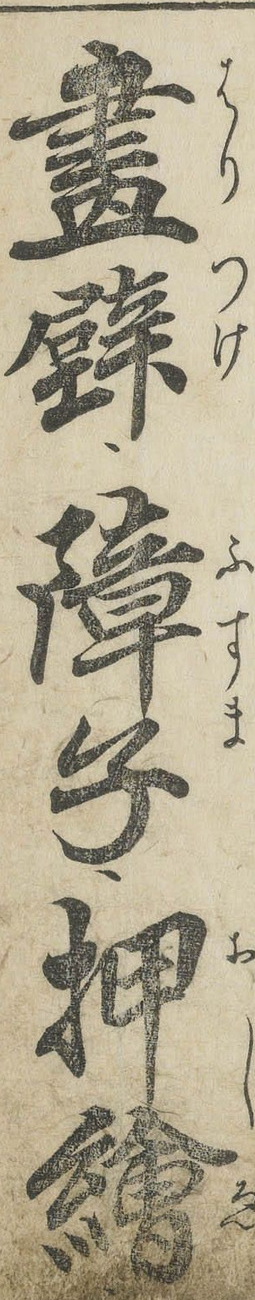画壁障子押絵

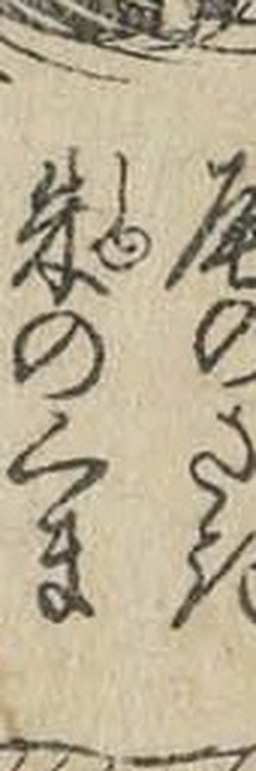朱のくま
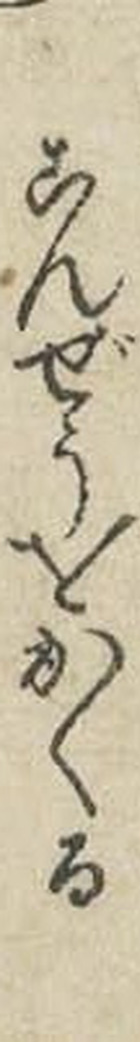こんぜうをかくる
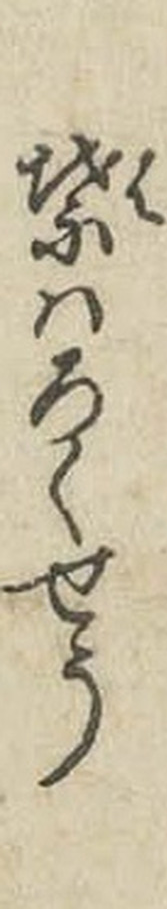葉はろくせう
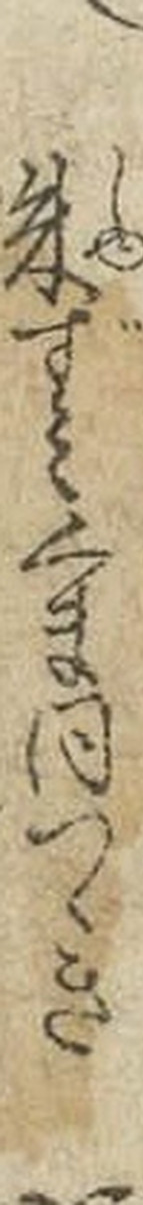朱ずみくま同つゝき
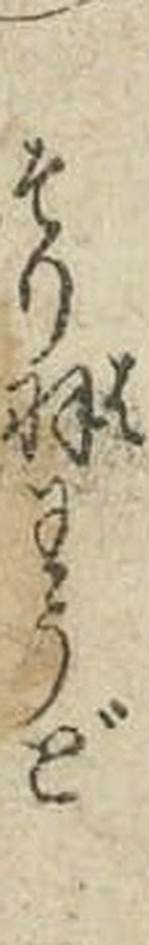そり羽わうど
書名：絵本写宝袋 9巻 8之巻
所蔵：東京学芸大学教育コンテンツアーカイブ
